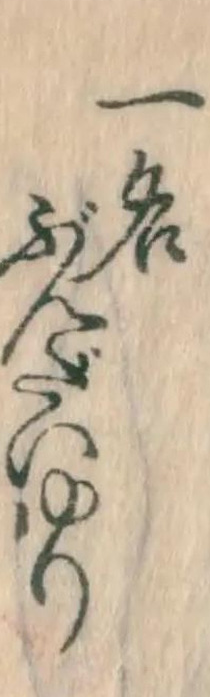ぶんだいゆり
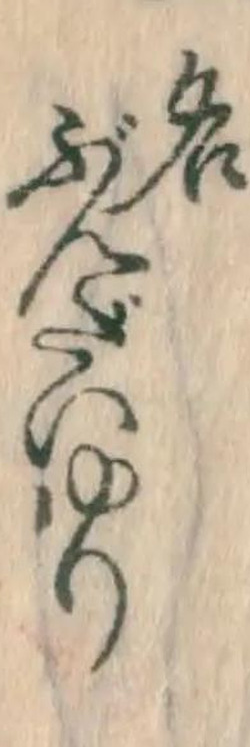ぶんだいゆり
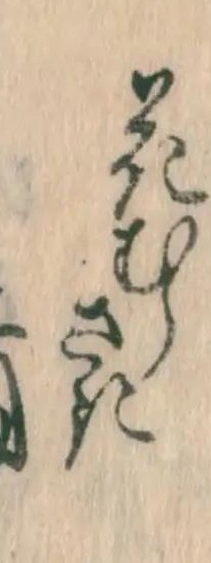花むらさき
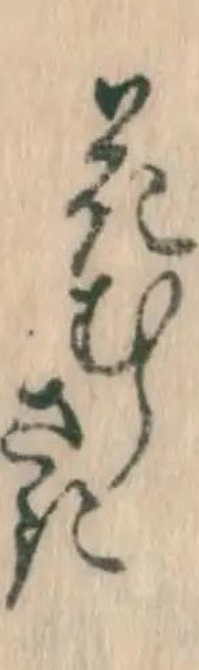花むらさき
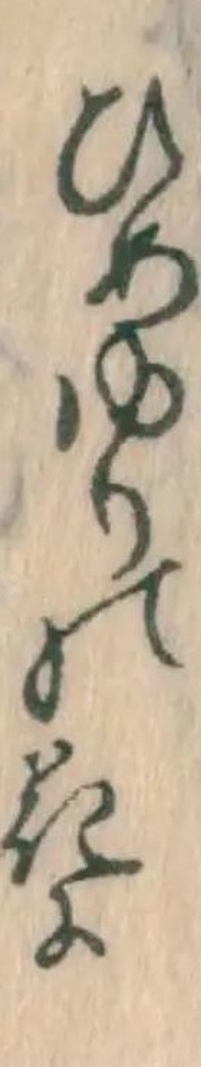ひめゆりの花に
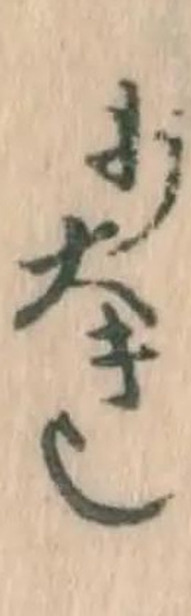少大き也
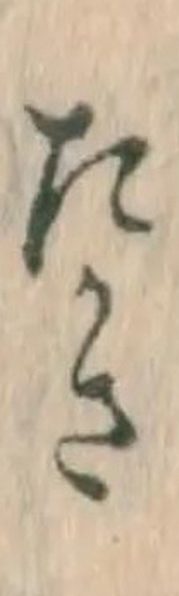たかさ
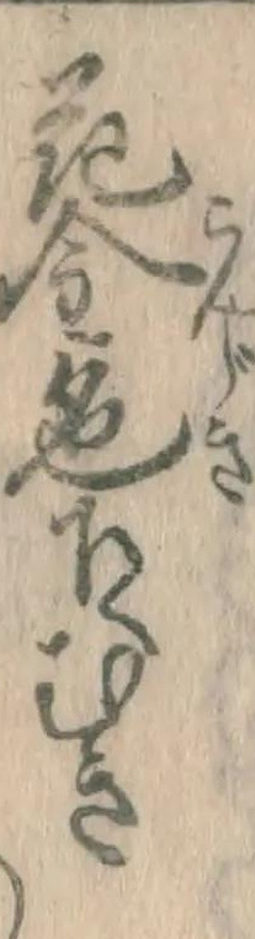花金色下へむき
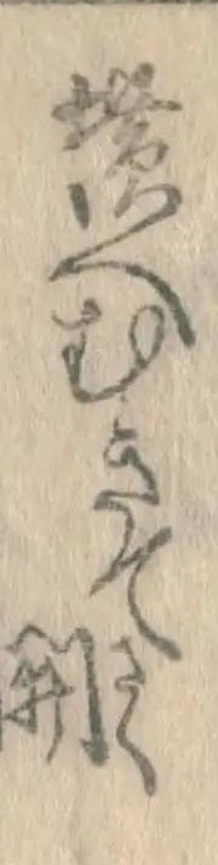横へむきて開
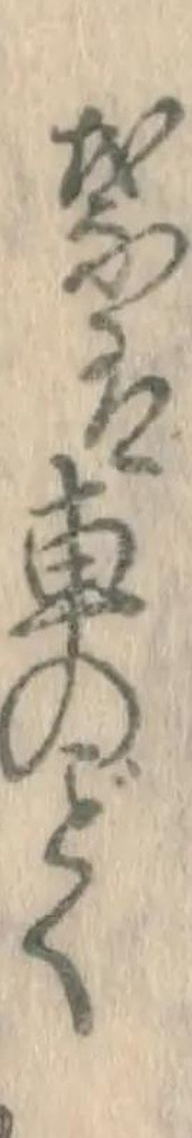葉は車のごとく
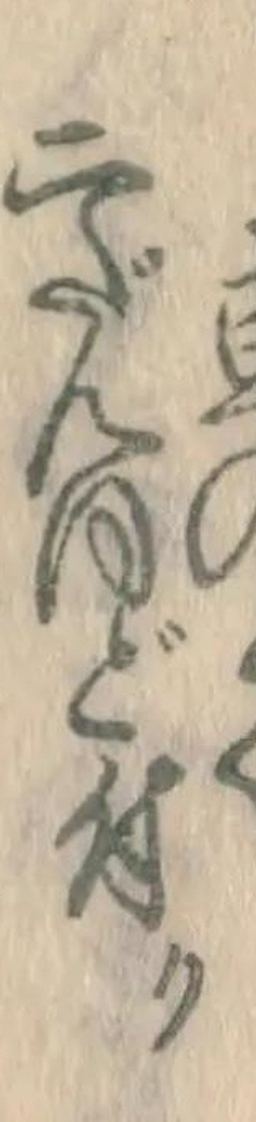二だんほど付く
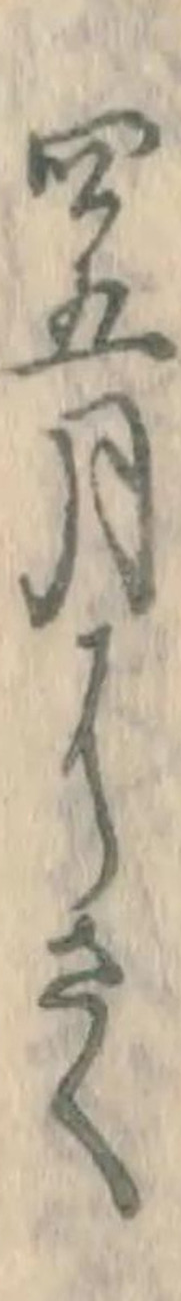四五月にさく

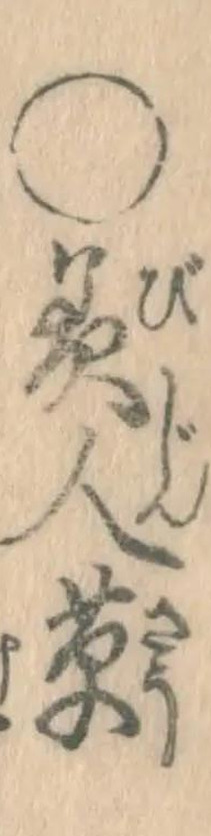〇美人草
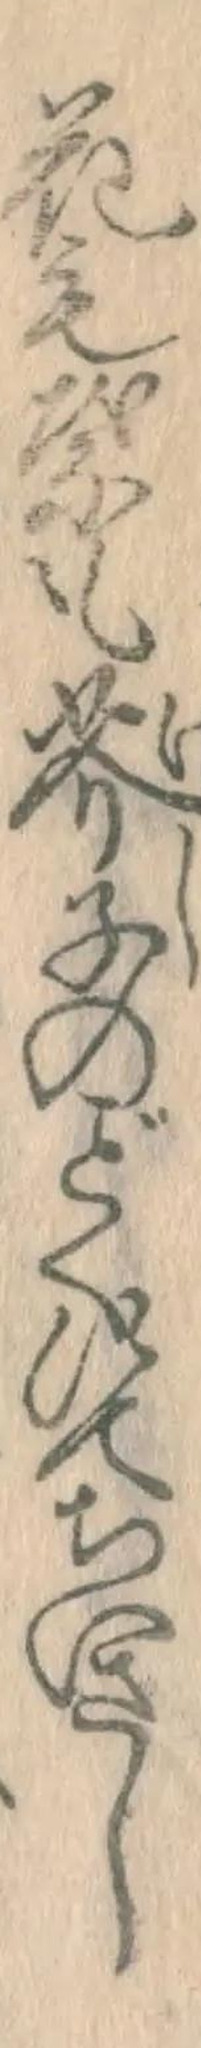花も葉も芥子のごとくにてちいさく
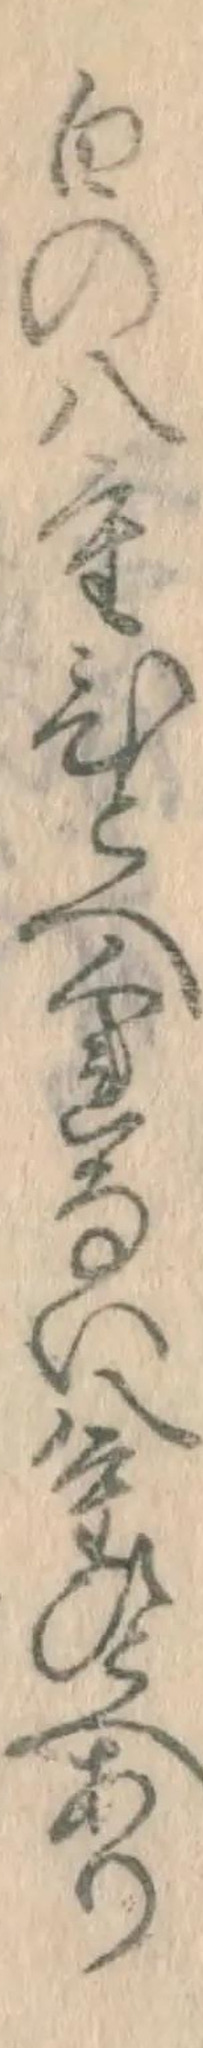白の八重ひとへくれない八重ひとへあり
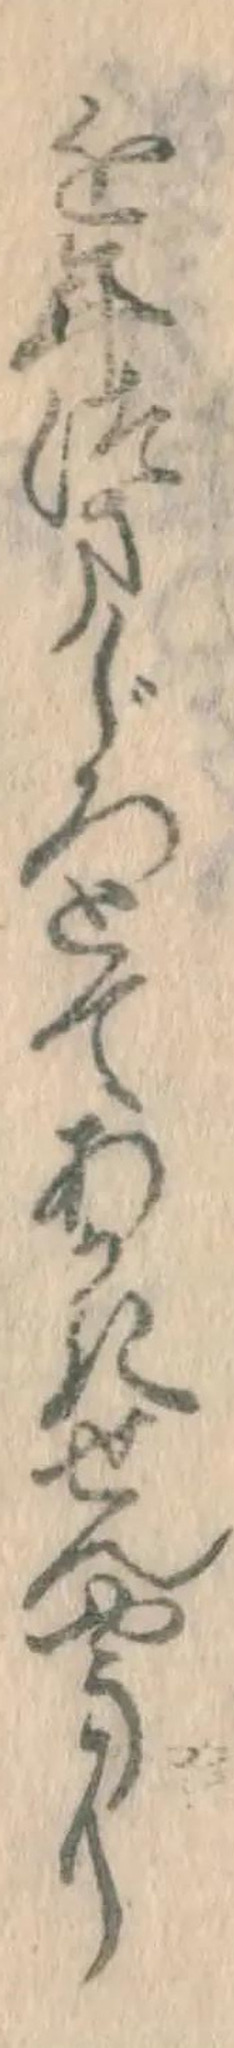近年つまじろとてあかきせんやうに
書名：艸花繪前集. [1]
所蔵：国立国会図書館 National Diet Library, JAPAN
